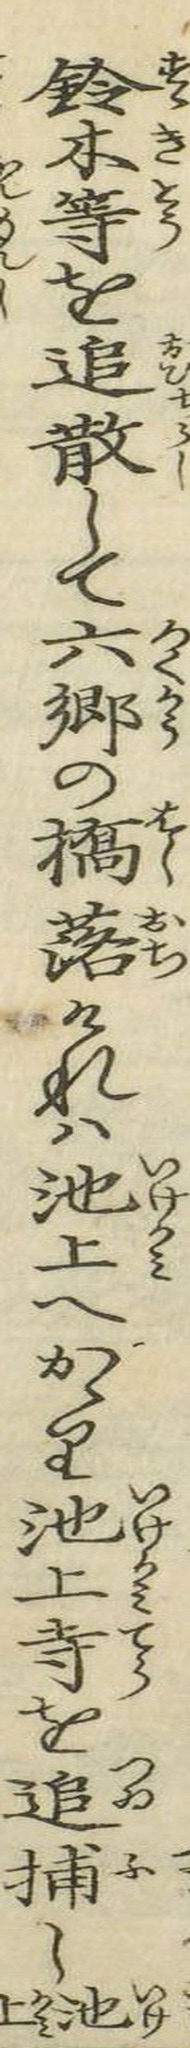鈴木等を追散して六郷の橋落けれは池上へかゝり池上寺を追捕し池上
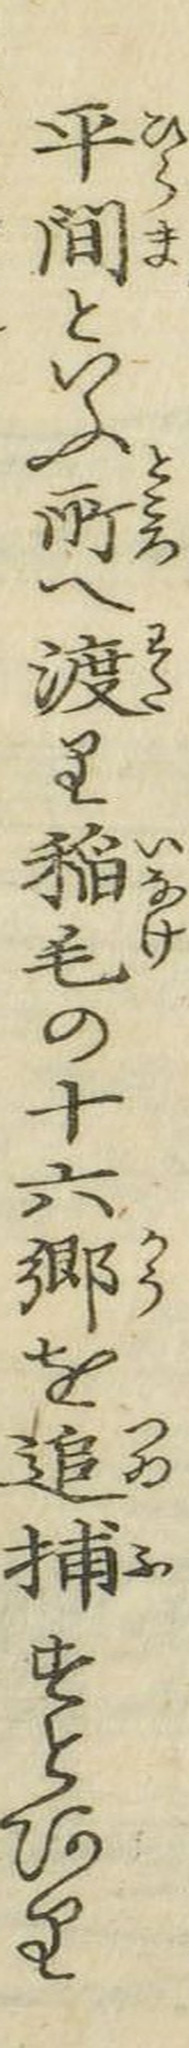平間といふ所へ渡り稲毛の十六郷を追捕すとあり
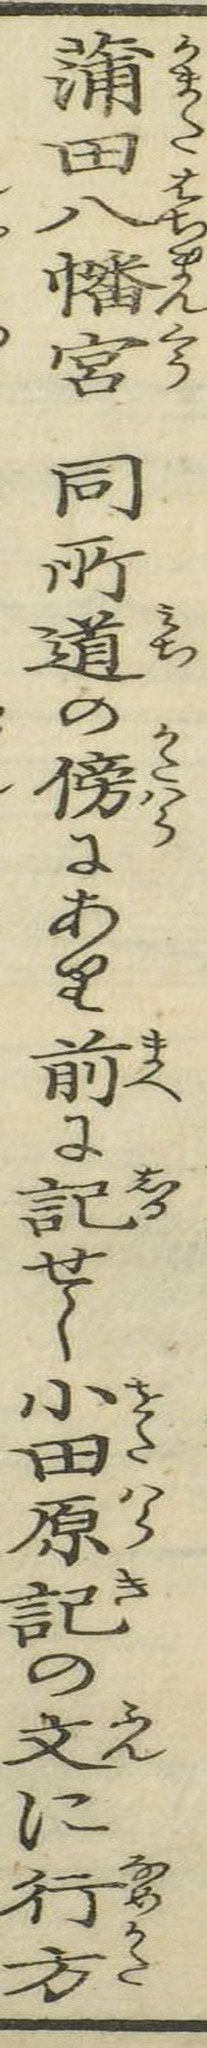蒲田八幡宮同所道の傍にあり前に記せし小田原記の文に行方
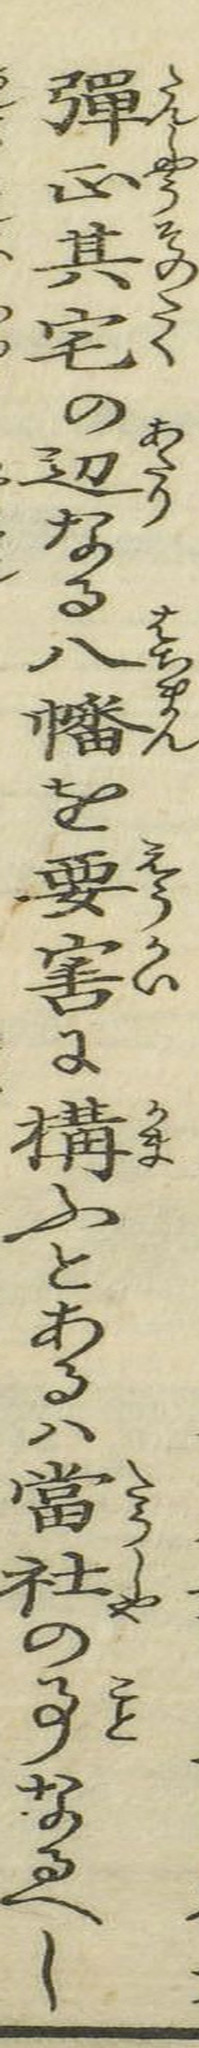彈正其宅の辺なる八幡を要害に搆ふとあるは當社の事なるへし
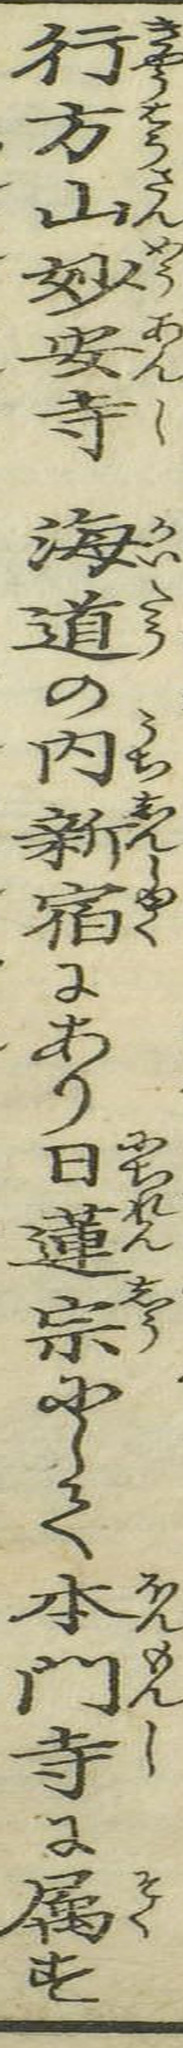行方山妙安寺海道の内新宿にあり日蓮宗にして本門寺に属す
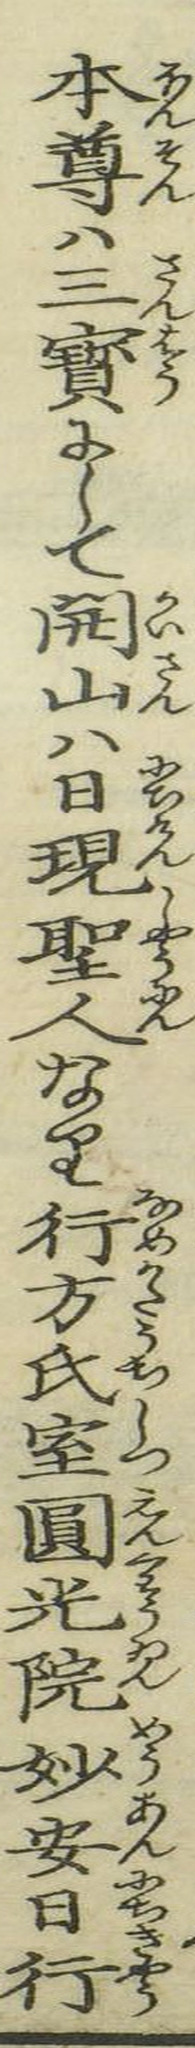本尊は三寳にして開山は日現聖人なり行方氏室圓光院妙安日行

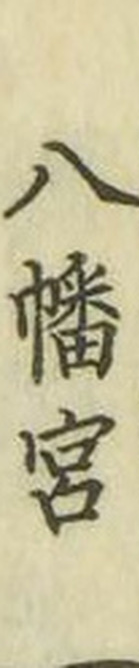八幡宮
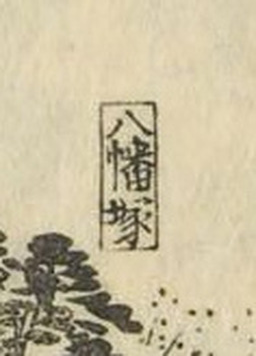八幡塚

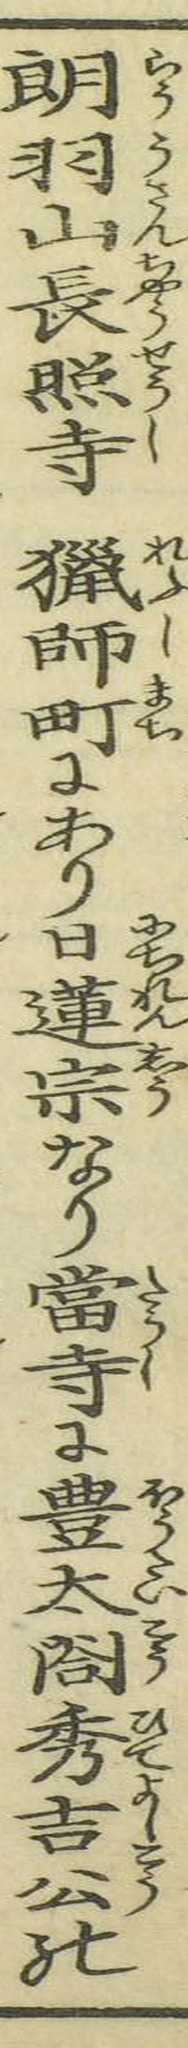朗羽山長照寺獵師町にあり日蓮宗なり當寺に豊太閤秀吉公の
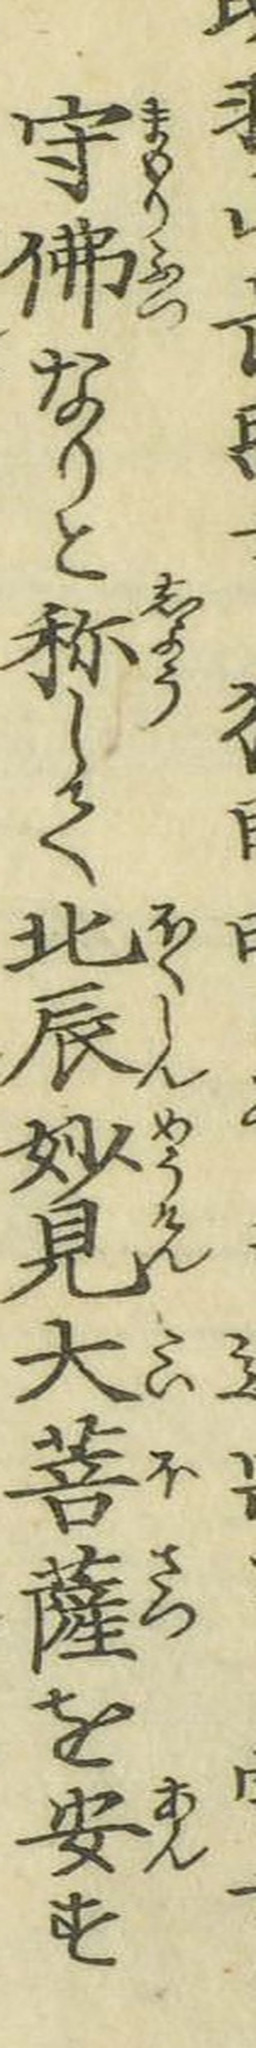守佛なりと称して北辰妙見大菩薩を安す
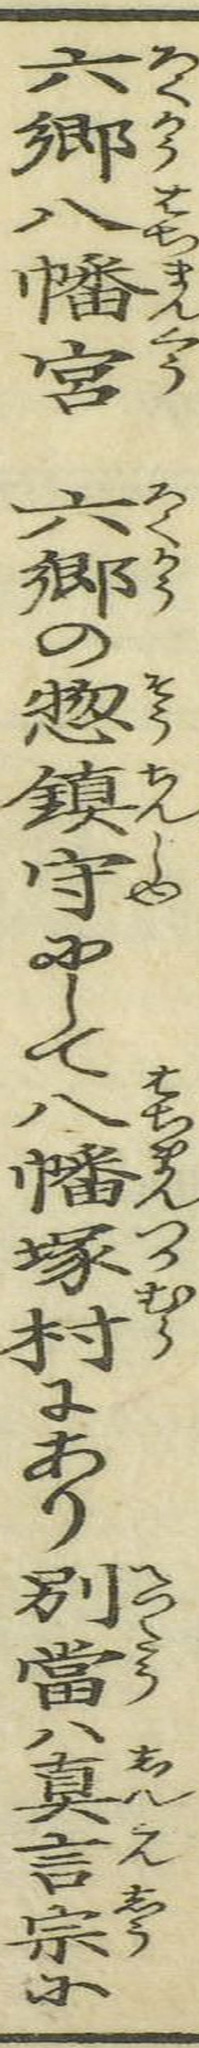六郷八幡宮六郷の惣鎮守にして八幡塚村にあり別當は真言宗に
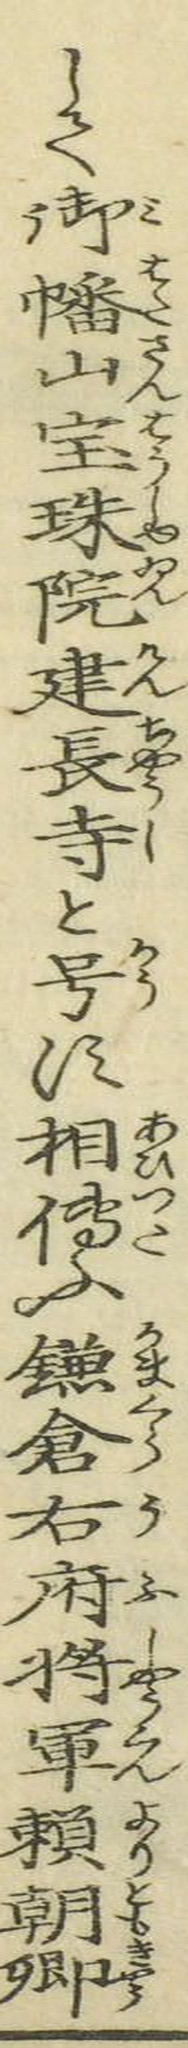して御幡山宝珠院建長寺と号す相傳ふ鎌倉右府将軍頼朝卿
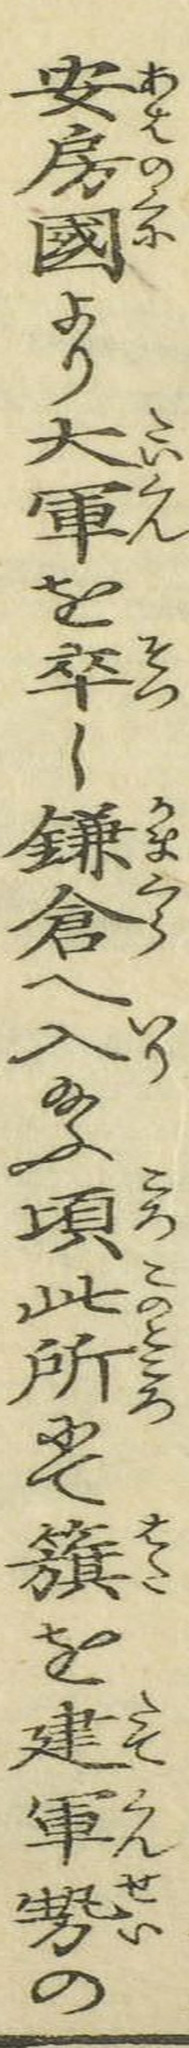安房國より大軍を卒し鎌倉へ入給ふ頃此所にて籏を建軍㔟の
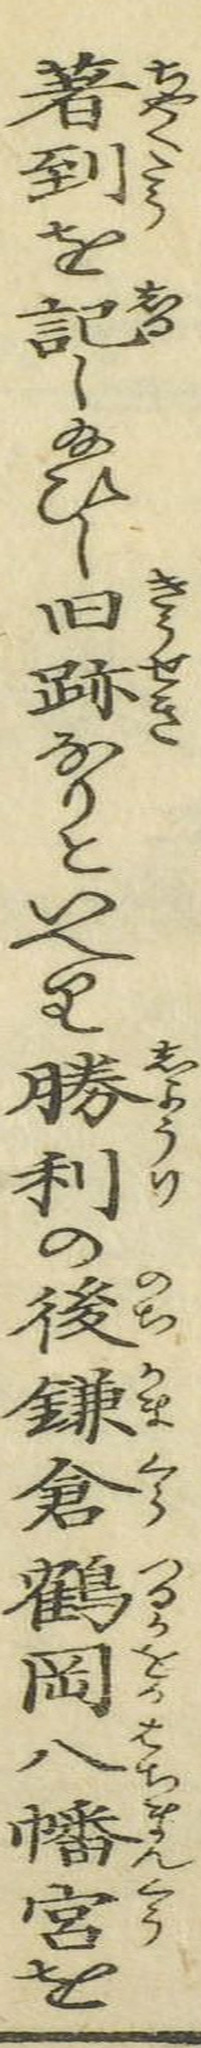著到を記し給ひし旧跡なりといへり勝利の後鎌倉鶴岡八幡宮を
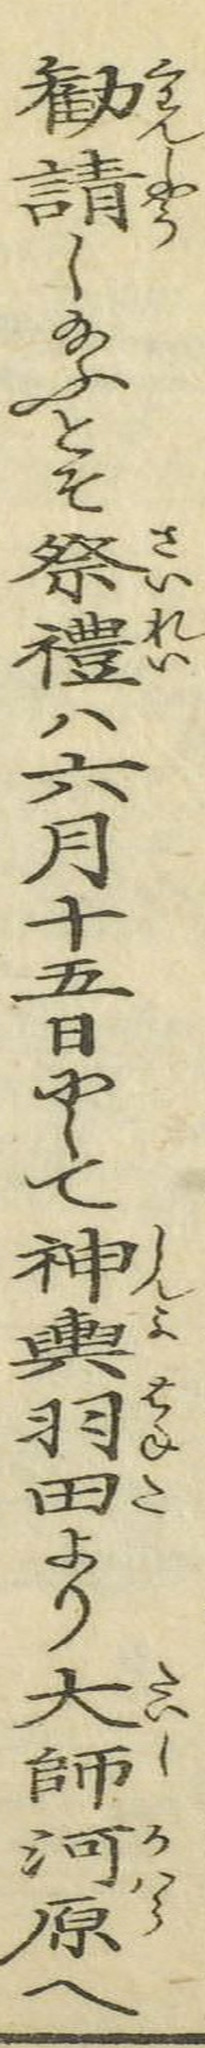勧進し給ふとそ祭禮は六月十五日にして神輿羽田より大師河原へ
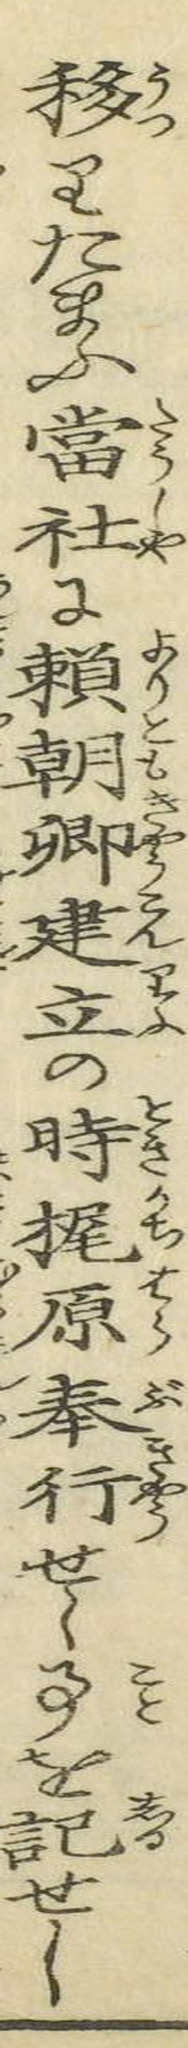移りたまふ當社に頼朝卿建立の時梶原奉行せし事を記せし
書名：江戸名所図会 20巻 巻之4
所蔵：東京学芸大学教育コンテンツアーカイブ
